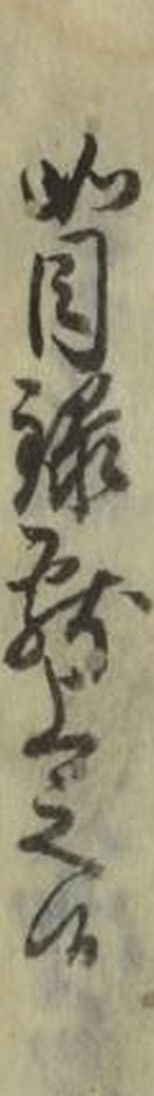如目録献上之候
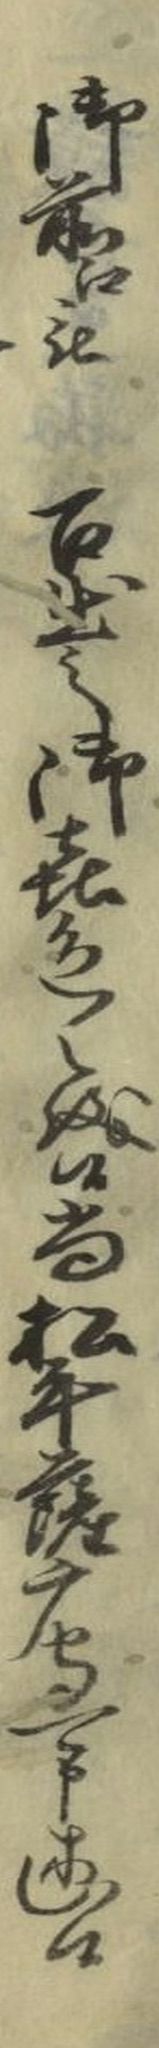御前え披召出之御喜色之儀候尚松平薩摩守可申述候
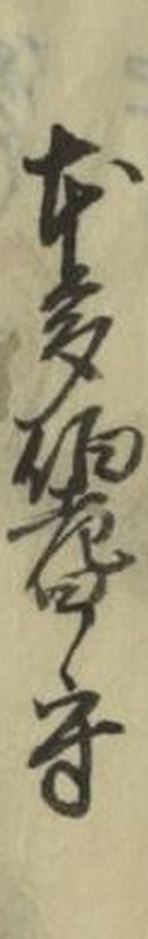本多伯耆守
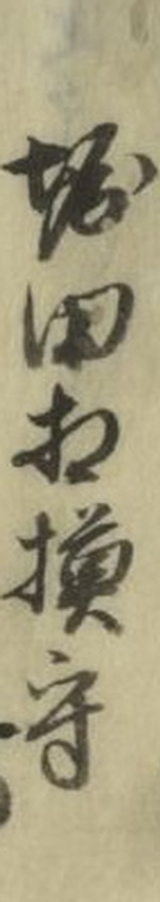堀田相模守
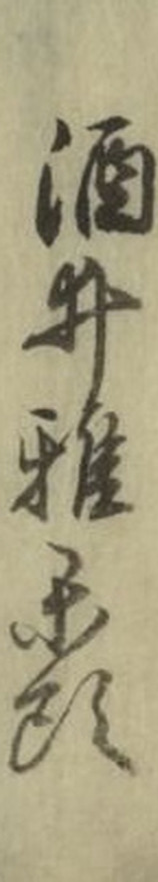酒井雅楽頭
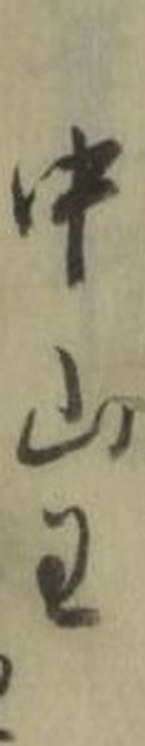中山王

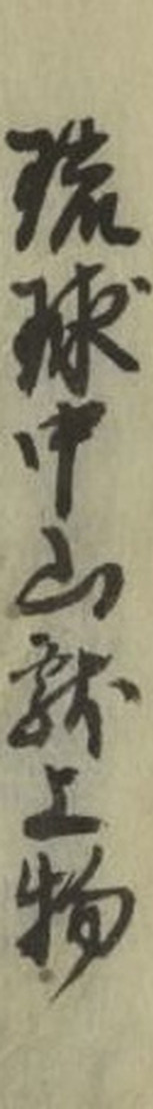琉球中山献上物
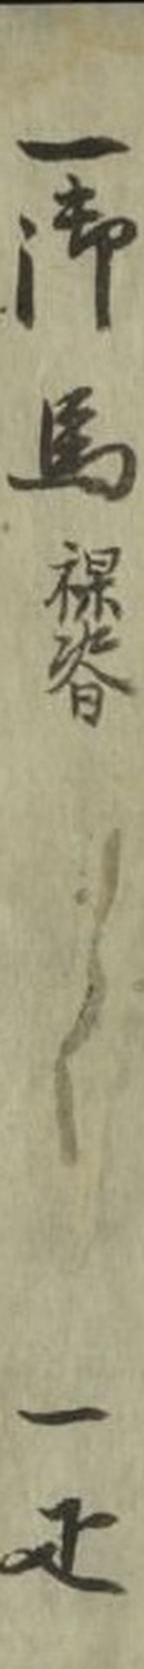一御馬裸背一疋
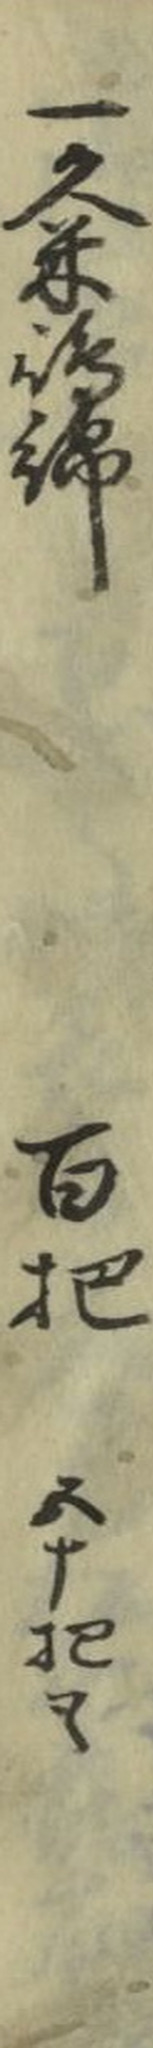一久米嶋綿百把五十把ツヽ
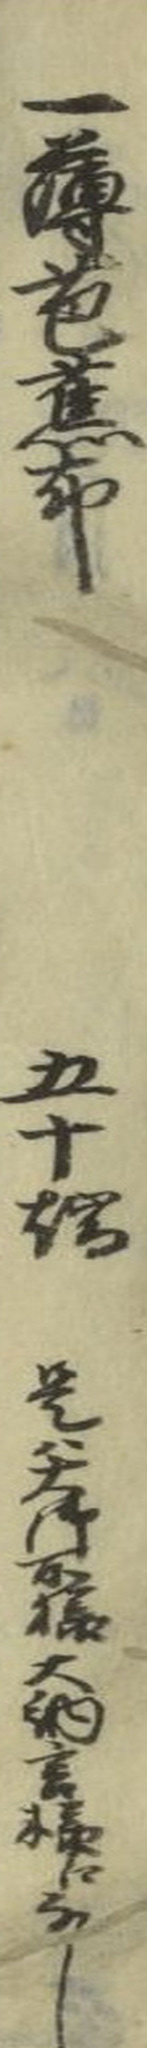一薄芭蕉布五十端是は大御所様大納言様えなし
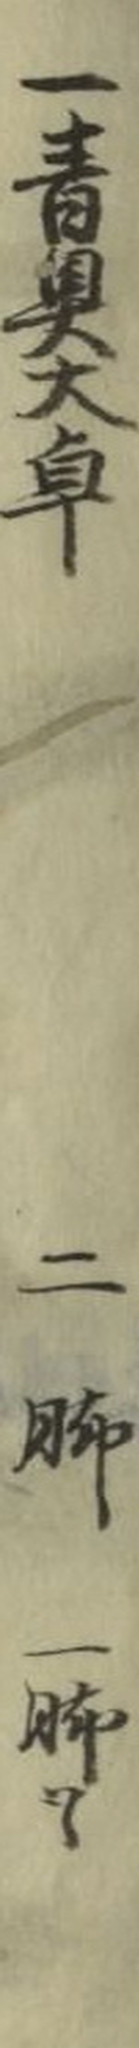一青貝大卓二脚一脚ツヽ
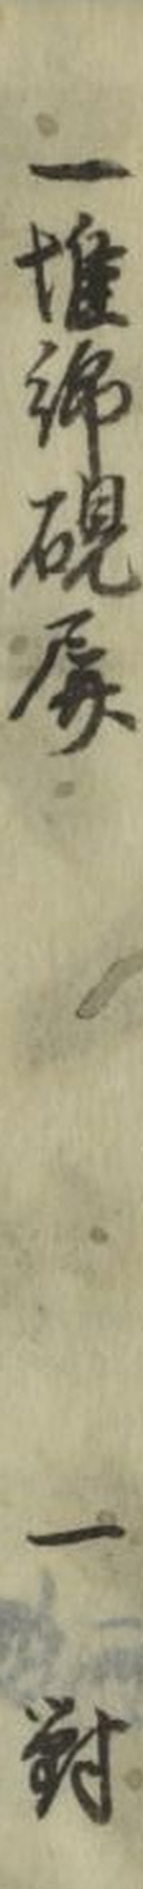一堆錦硯屏一対
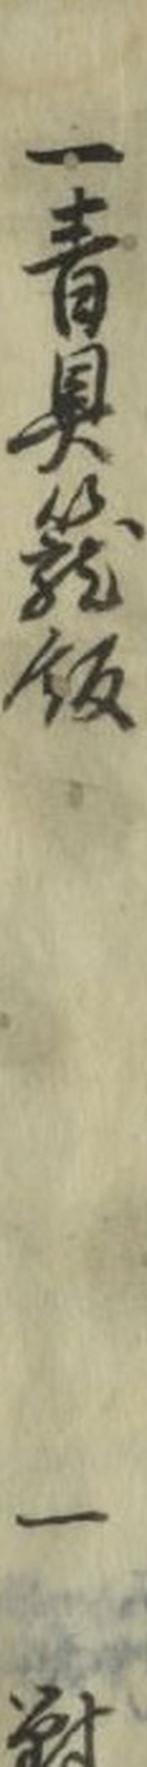一青貝籠飯一対
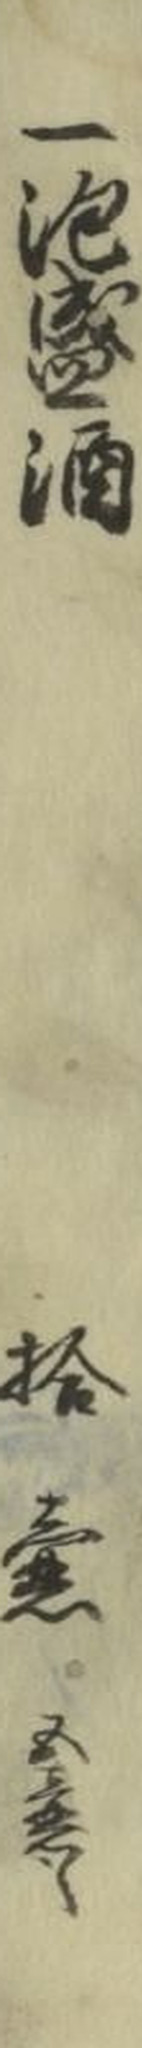一泡盛酒拾壺五壺ツヽ
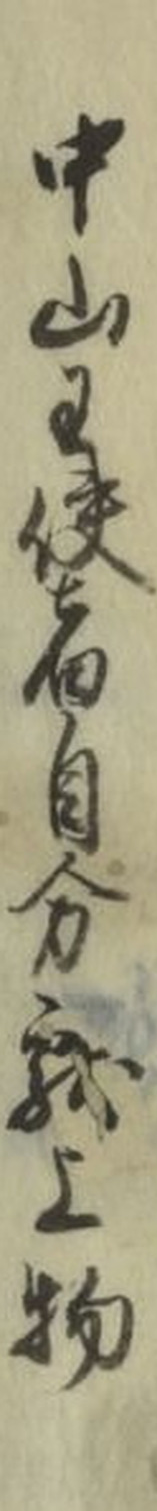中山王使者自分献上物
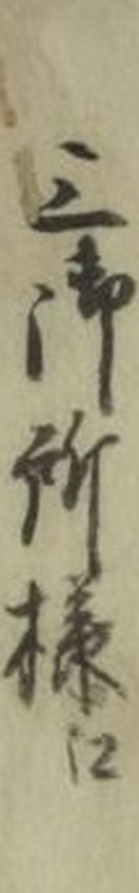三御所様え
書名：琉球人来朝之記
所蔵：University of the Ryukyus Library
